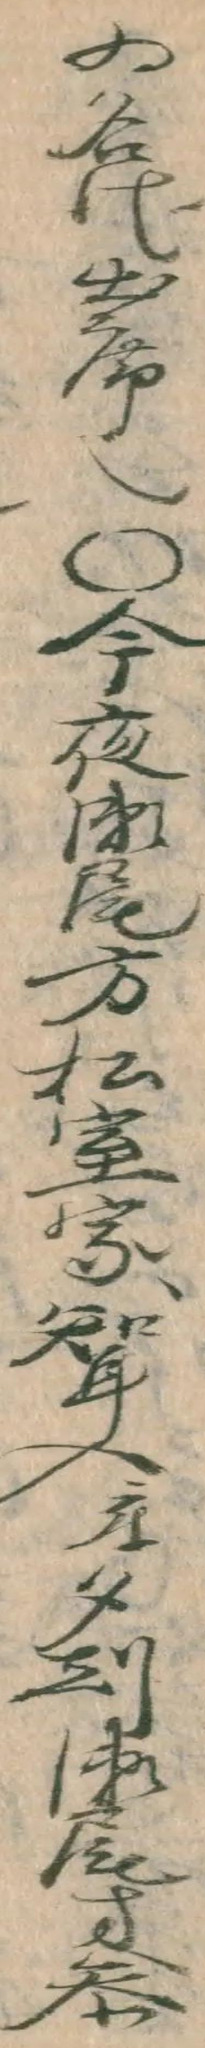為名代出席也○今夜瀬尾方松室家ヘ聟入ニ付夕刻瀬尾村へ参
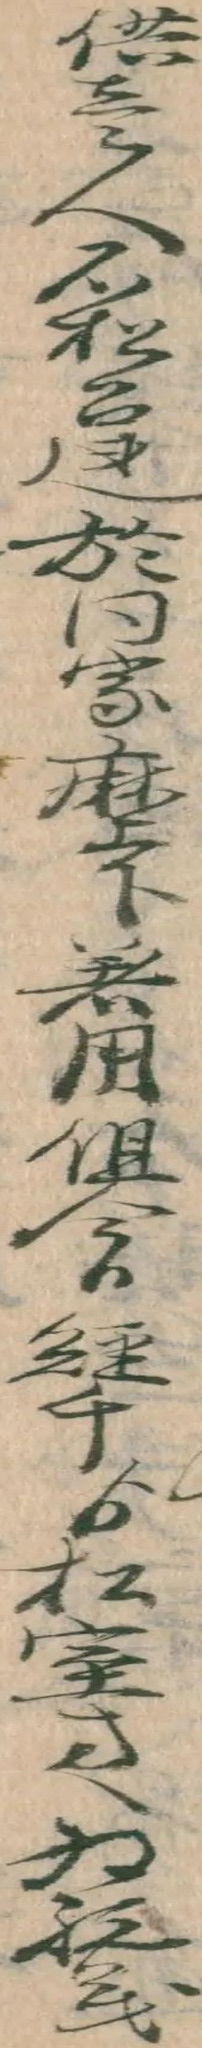供壱人石松召連於同家麻上下着用但今日経千ゟ松室方へ為祝義
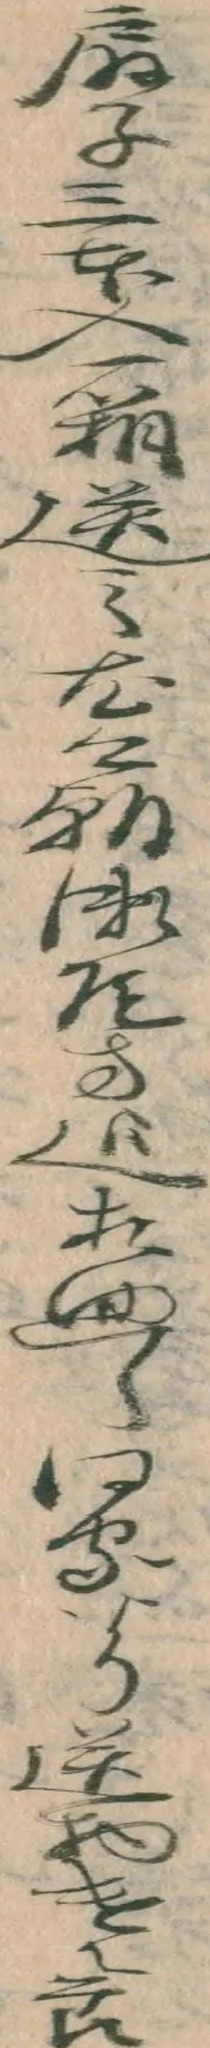扇子三本入一箱送之尤今朝瀬尾方迄相廻了同家より送物遣候節
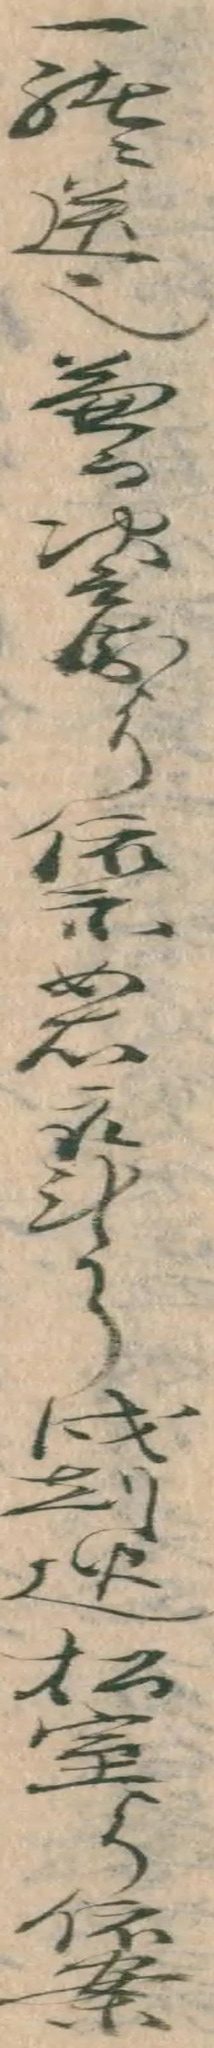一躰ニ送也兼而次兵衛より依示如右取斗了戌刻過松室より依案
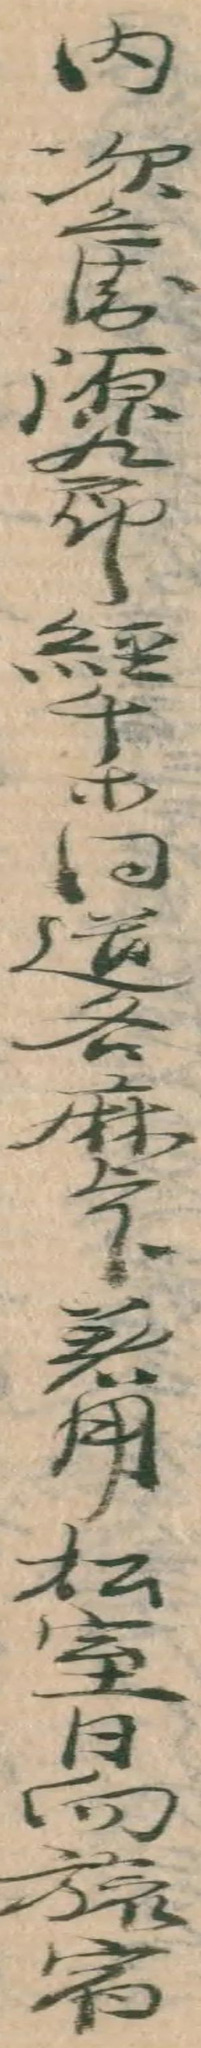内次兵衛源九郎経千等同道各麻上下着用松室日向旅宿
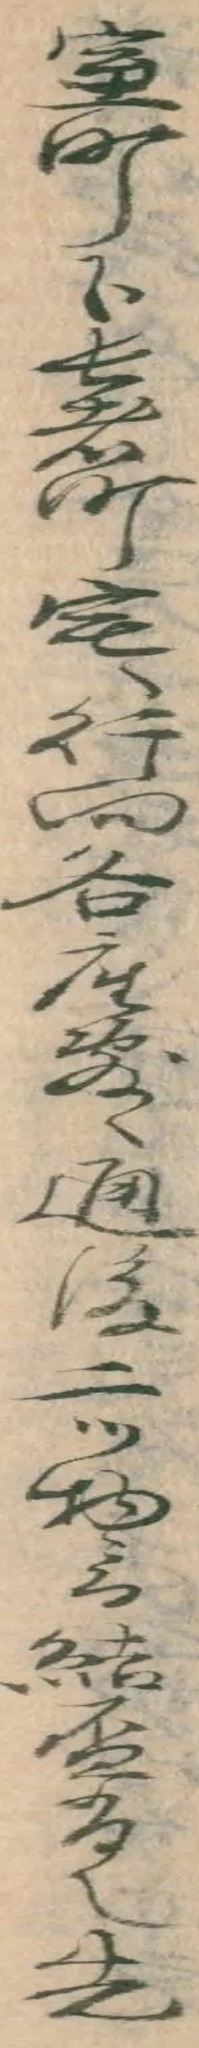室町下長者町宅へ行向各座敷へ通後二ツ物ニ而結盃有之に先
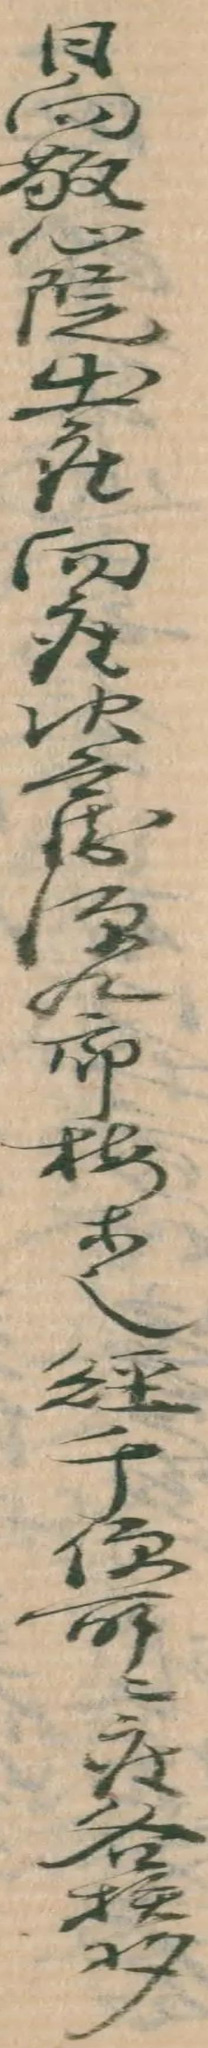日向敬心院出座向座次兵衛源九郎梅等也経千便所に座各挨拶
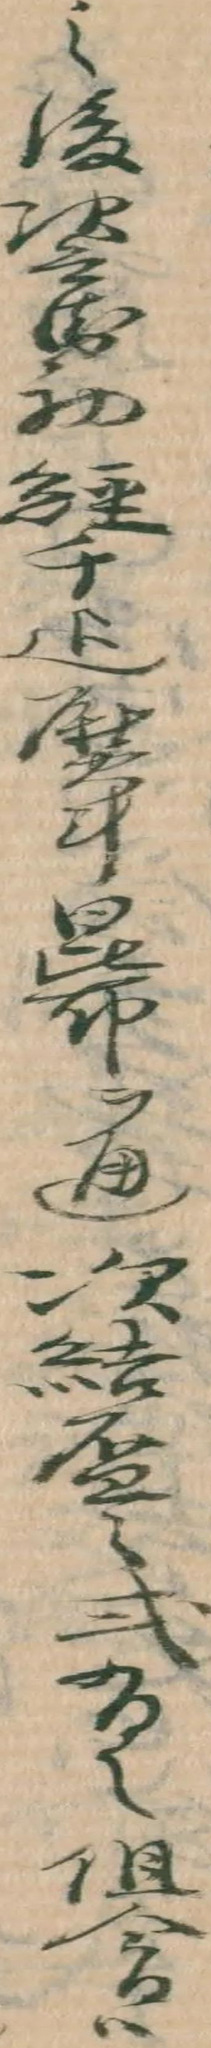之後次兵衛初経千迄熨斗昆布ヲ通次結盃之式有之但今日ハ
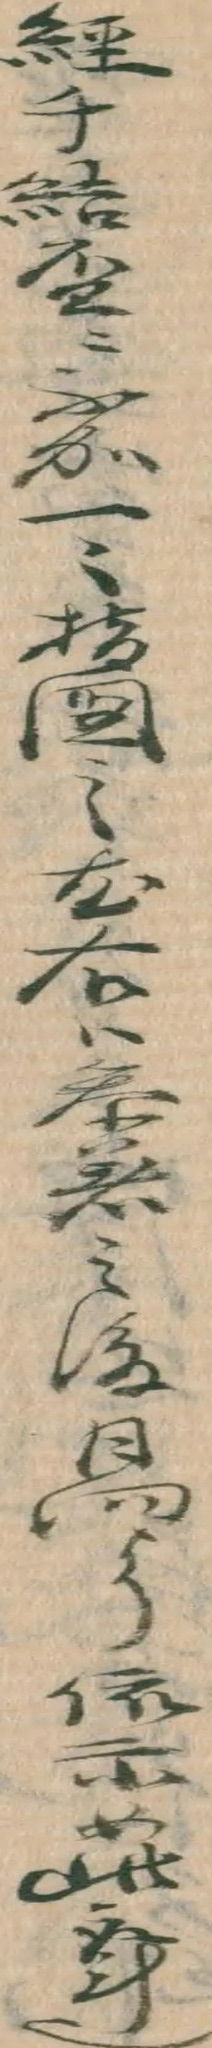経手結盃に不加一々指図之尤右ハ参着之後日向より依示如此取計也
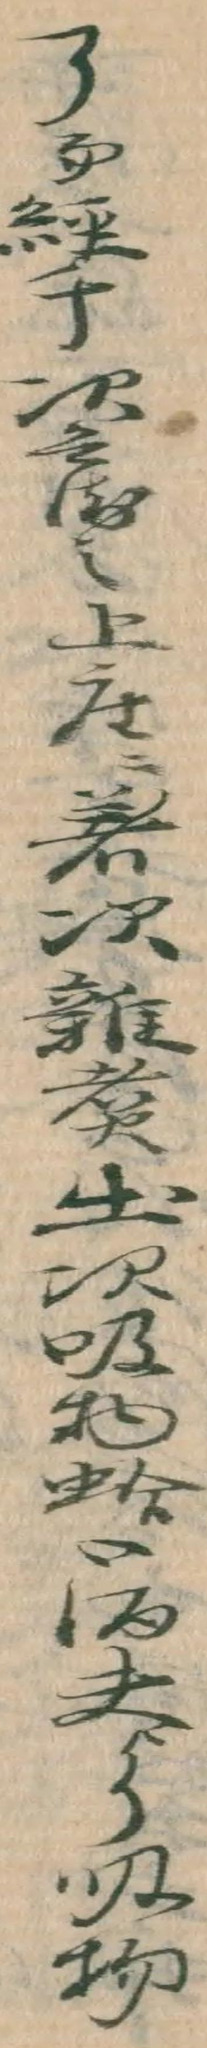了而経す次兵衛之上座に着次雑煮出次吸物蛤御酒夫より吸物
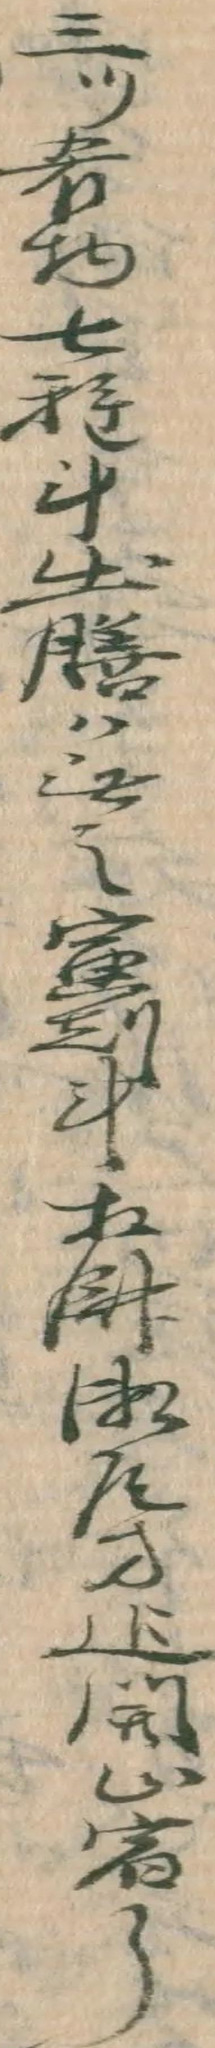三ツ肴物七種斗出膳ハ無之寅刻斗相済御道方迄開正宿了
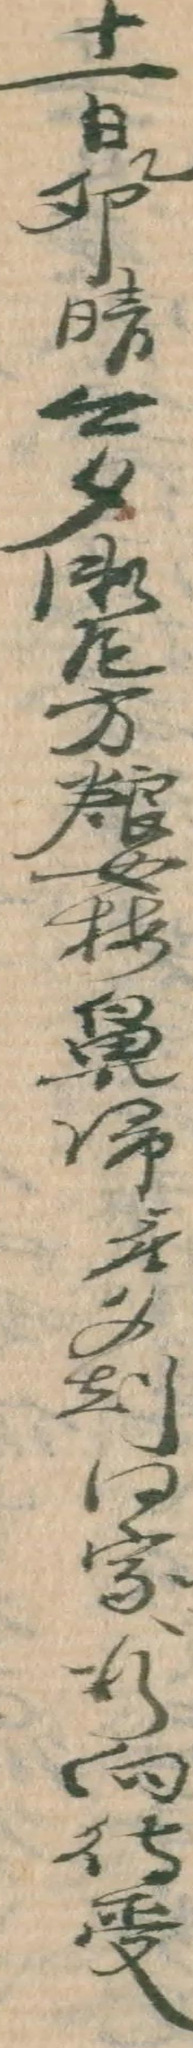十一日卯晴今夕御屋方養女楼鼻帰ニ付夕刻同家へ行向待受
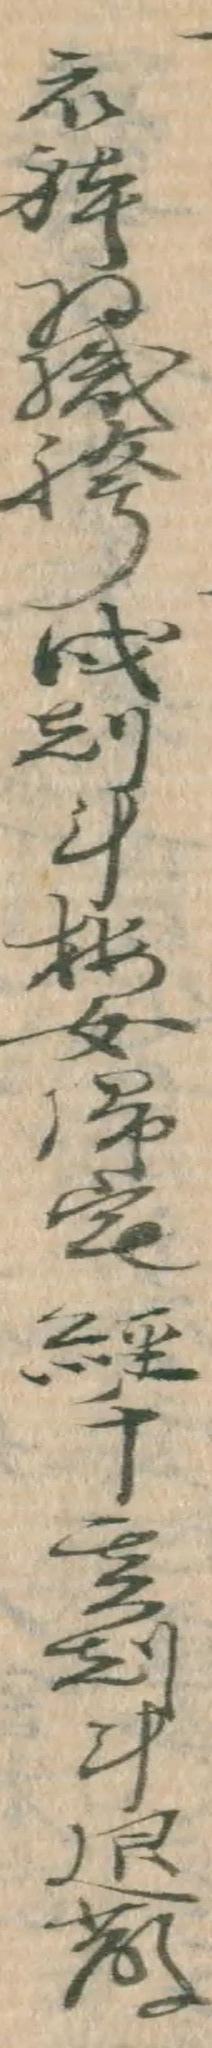衣躰羽織跨戌刻斗梅女帰宅経申亥刻斗退散
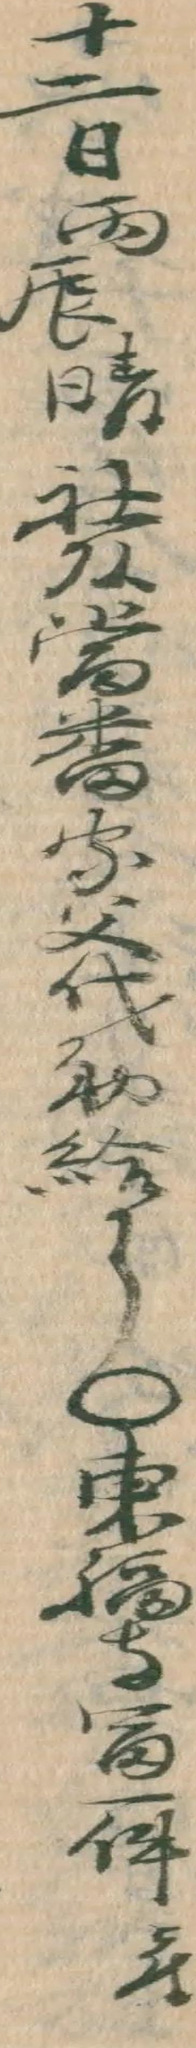十二日丙辰晴社及當番家父代勤給了○東福寺冨一件ニ付
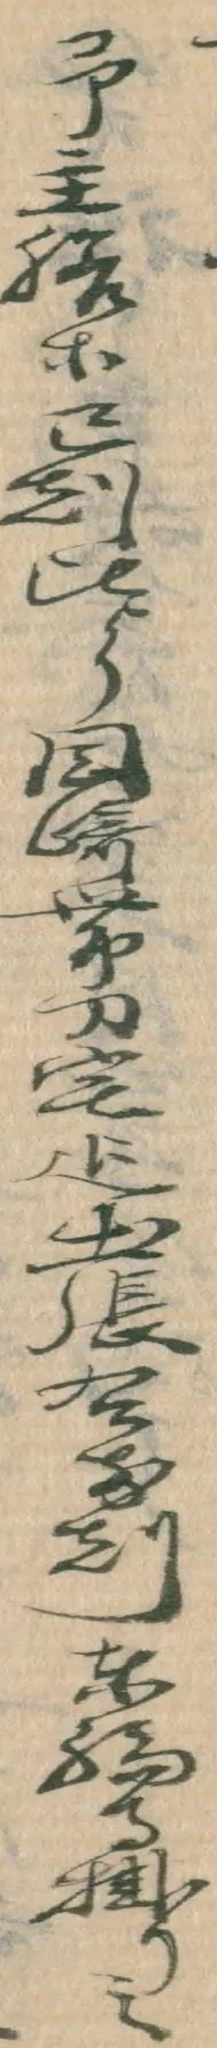予主膳等巳刻比より目崎帯刀宅迄出張右前刻東福寺掛リ之
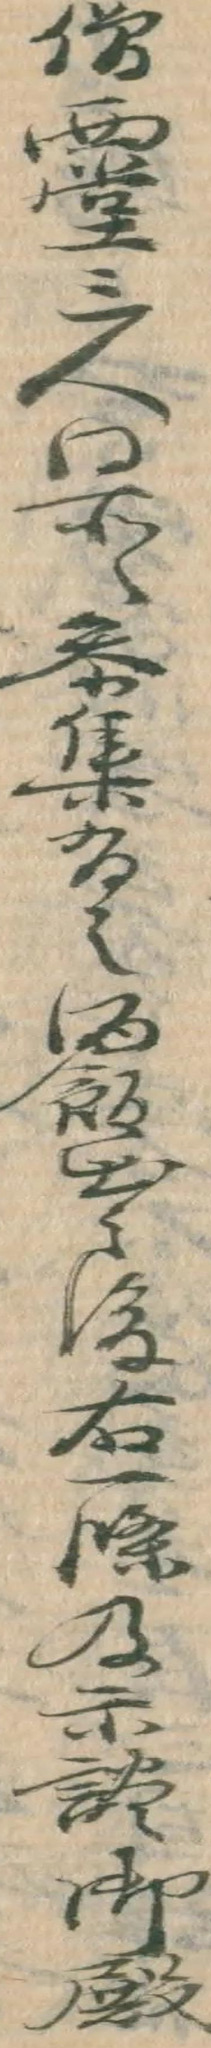僧西堂三人同所へ参集有之酒飯出之後右一條及示談御殿
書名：賀茂社記録. 第65冊
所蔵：国立国会図書館 National Diet Library, JAPAN
